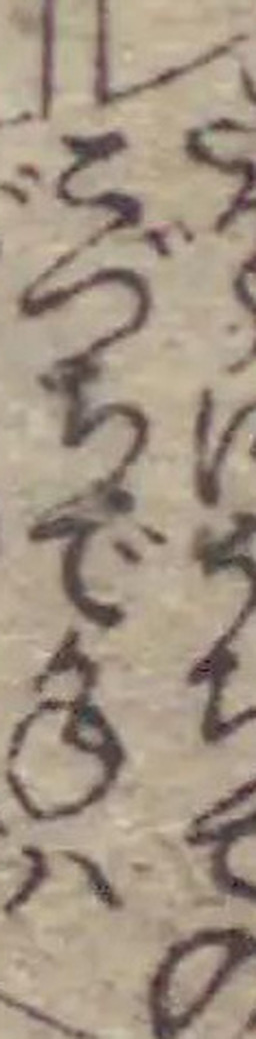こづちでかねは
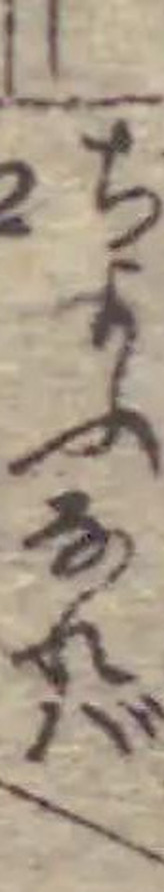ぢよふなれば
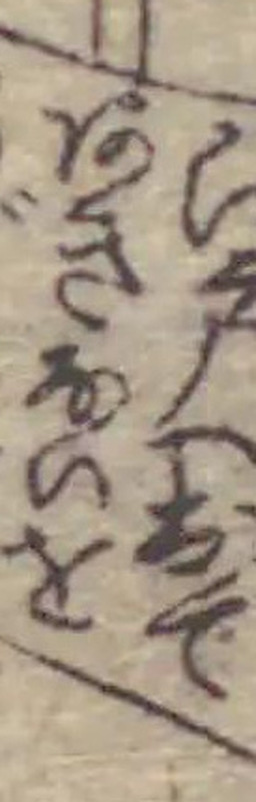あきないを
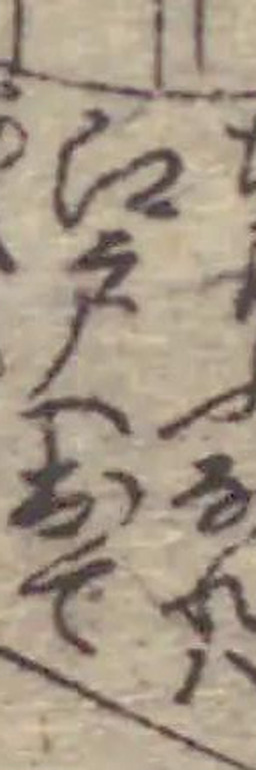江戸へ出て
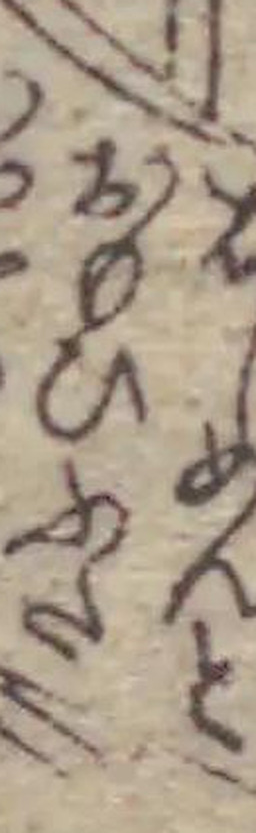おもひふた
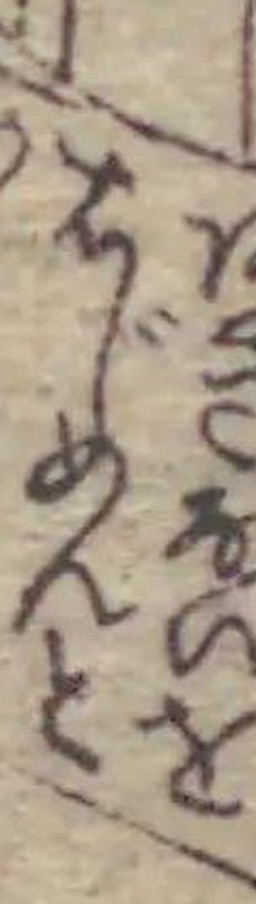はじめんと
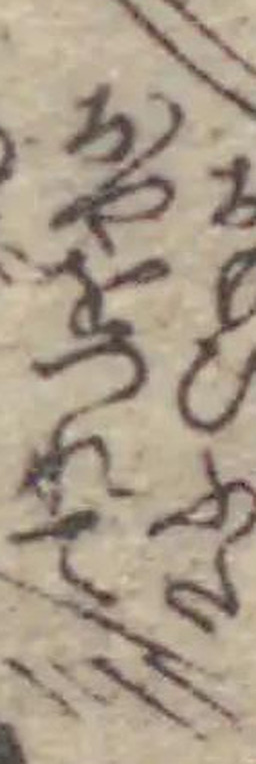おやをつれて
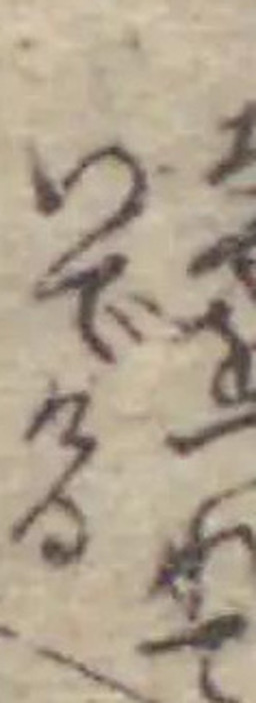いでける
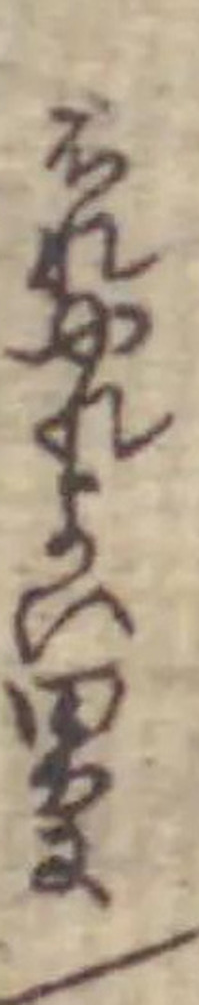ほれやれよい男に
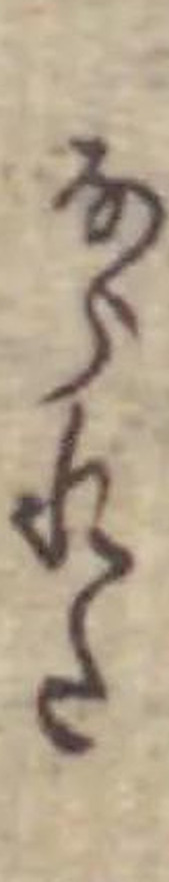なられた
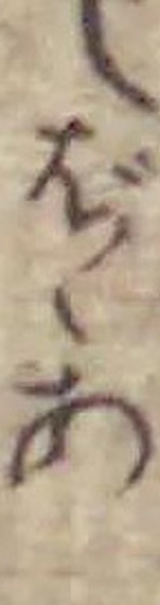ばゞあ
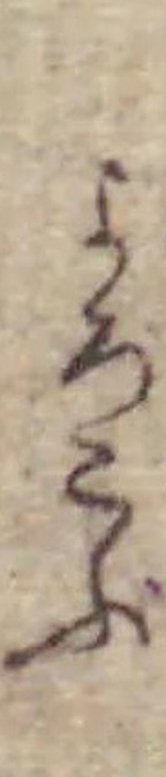よろこぶ
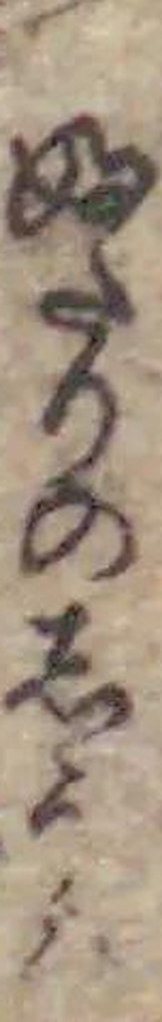ふたりのしう
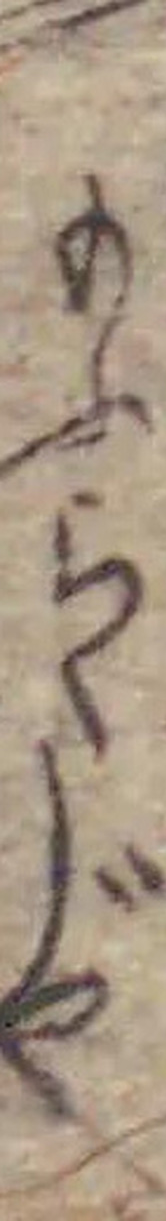もふらくじや

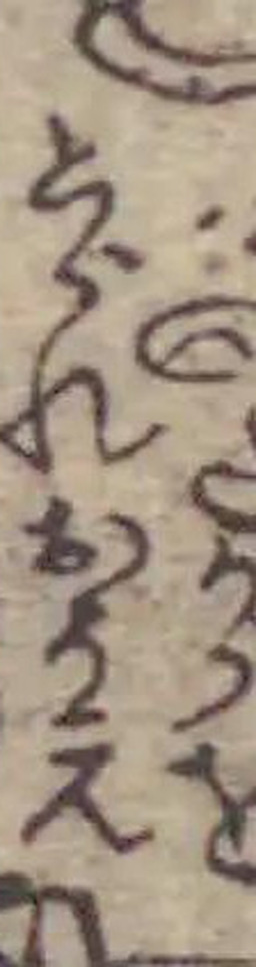とられおうこん
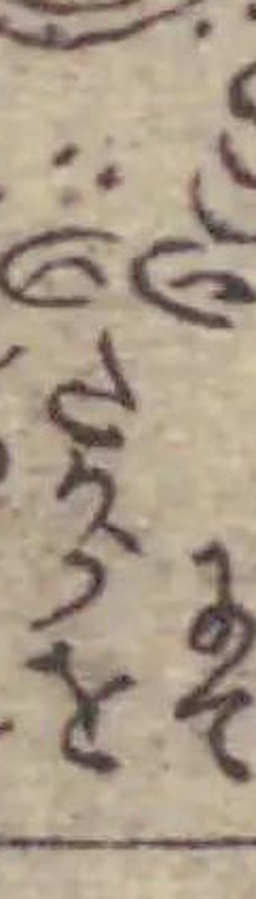たからを
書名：桃太郎元服姿 2巻
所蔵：国立国会図書館 National Diet Library, JAPAN
